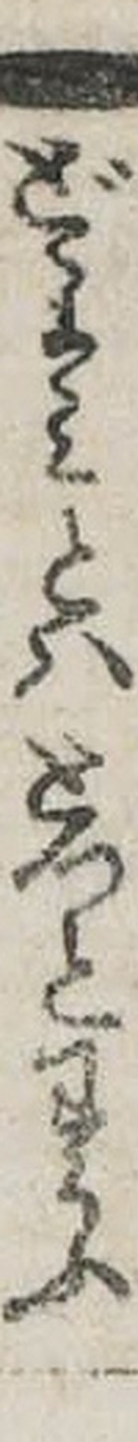どよみとはとつとわらふ
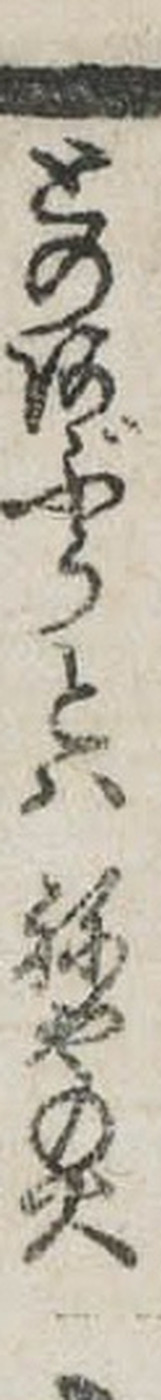とのあぶらとはねやの火
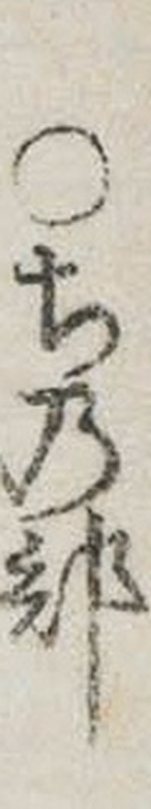○ちの部
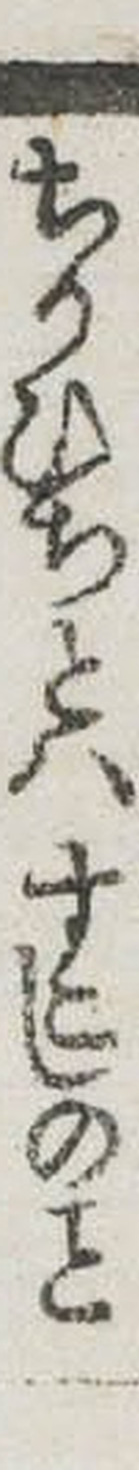ちりひちとはすこしのこと
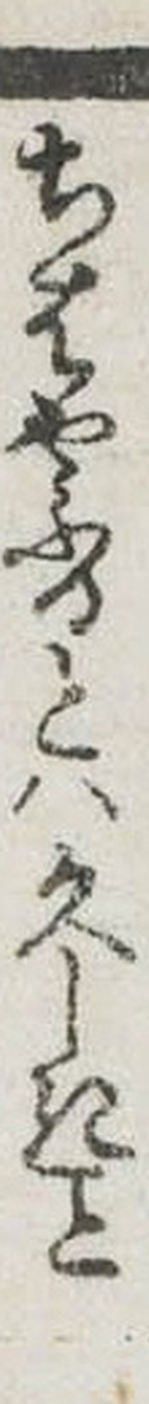ちはやふるとは久しきこと
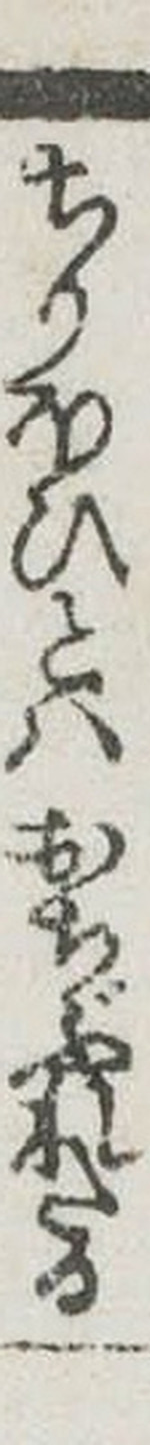ちりほひとはおちぶれたる
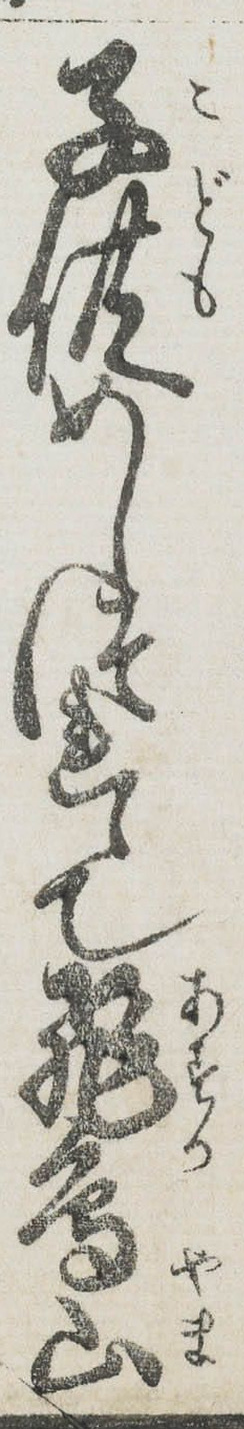子供めしつれ候て飛鳥山
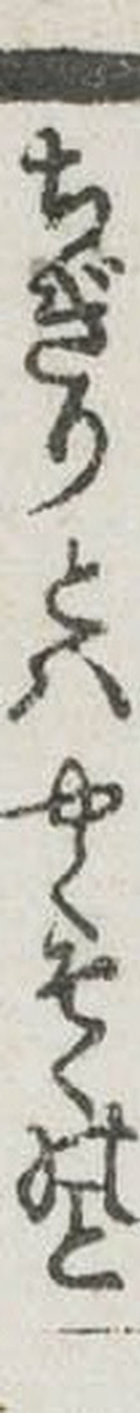ちぎりとはやくそくのこと
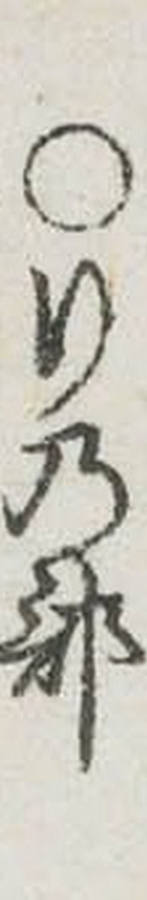○りの部
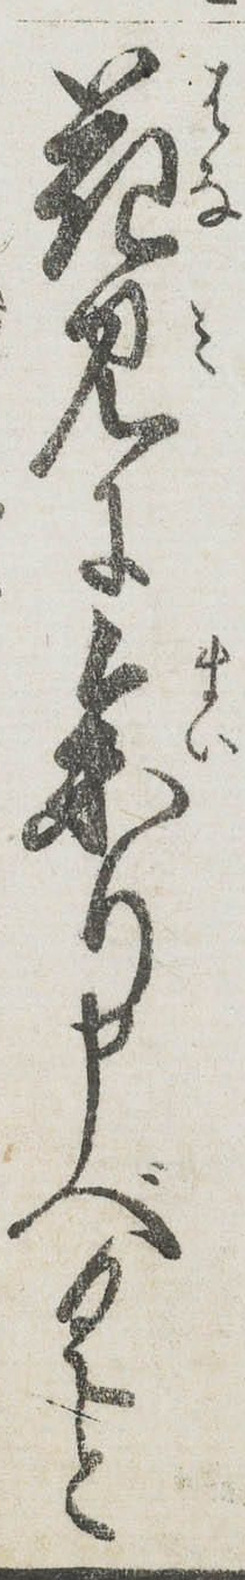花見に参り申べくと
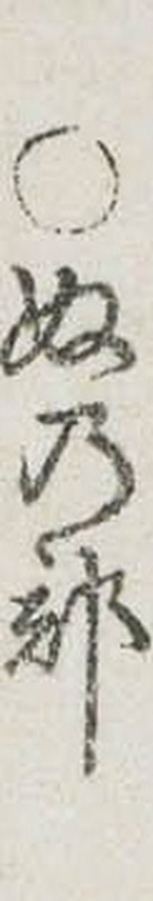○ぬの部
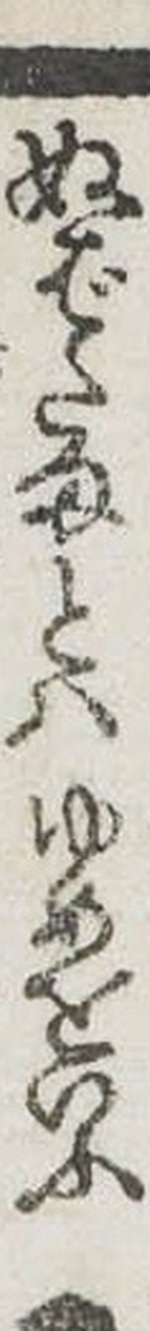ぬばたまとはゆめをいふ
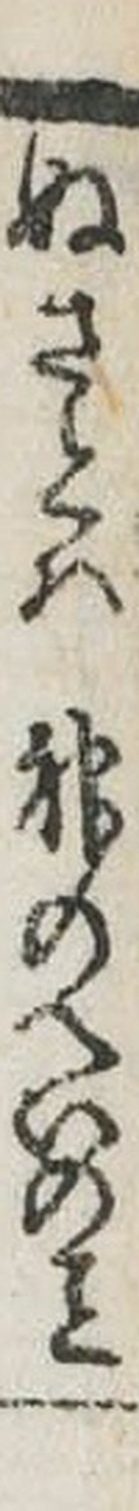ぬさとは神のへいのこと
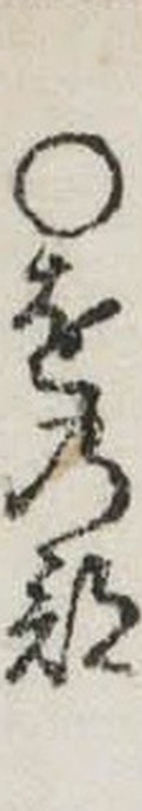○をの部
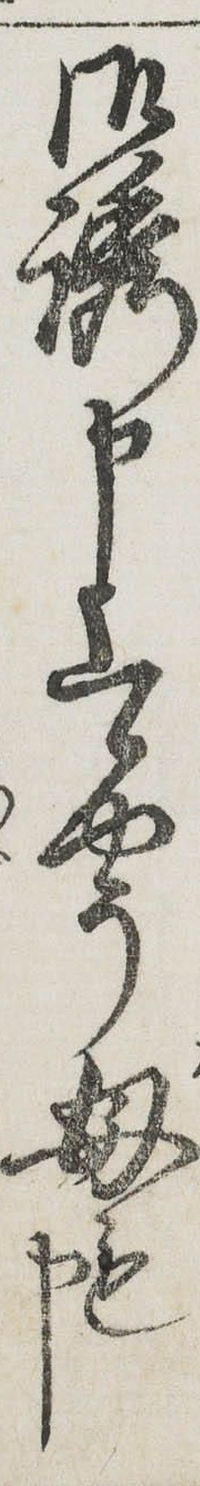御誘申上候やう母も申
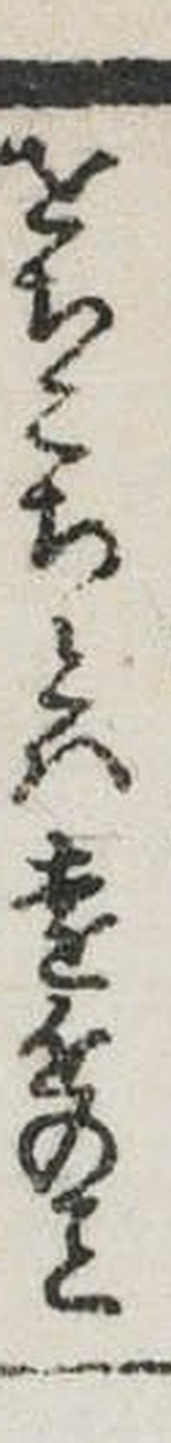をちこちとは遠近のこと
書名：頭書萬用婦人手紙之文言
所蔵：東京学芸大学教育コンテンツアーカイブ
